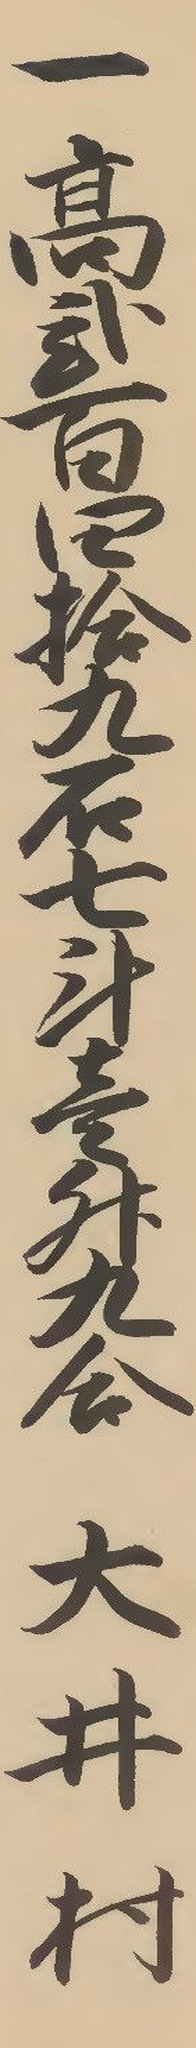一高弐百四拾九石七斗壱升九合大井村
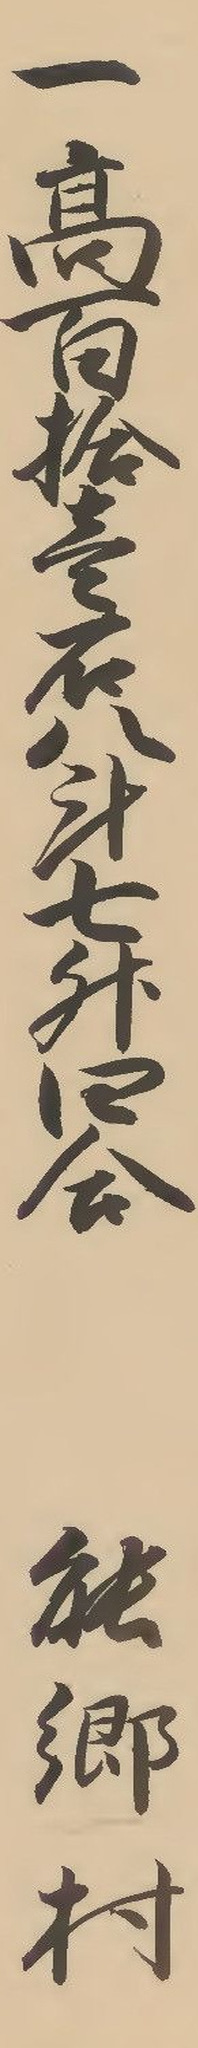一高百拾壱石八斗七升四合能郷村

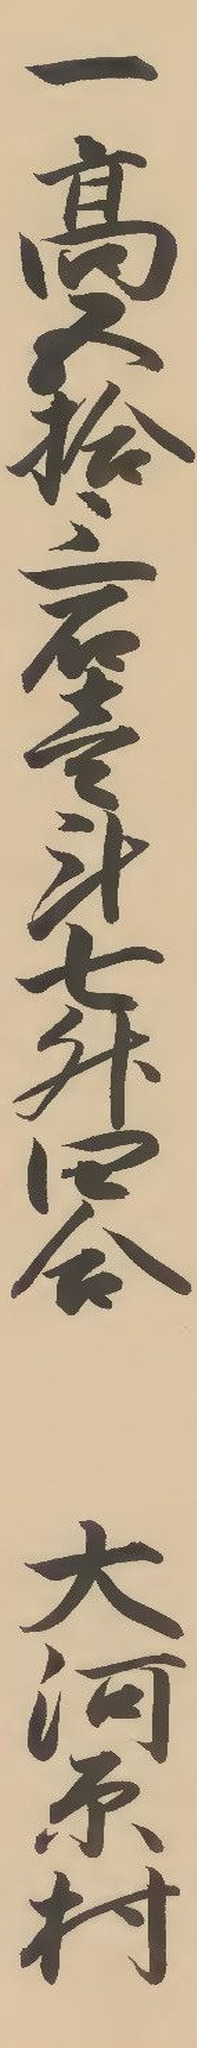一高五拾三石壱斗七升四合大河原村
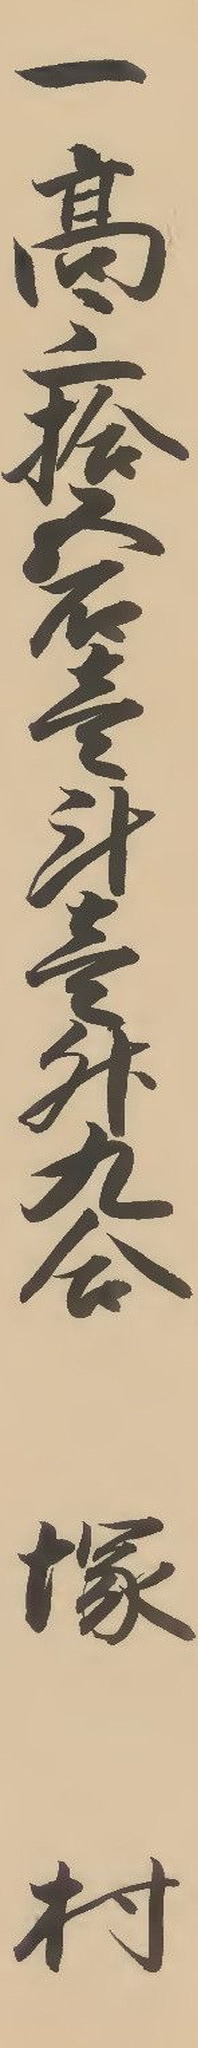一高三拾五石壱斗壱升九合塚村
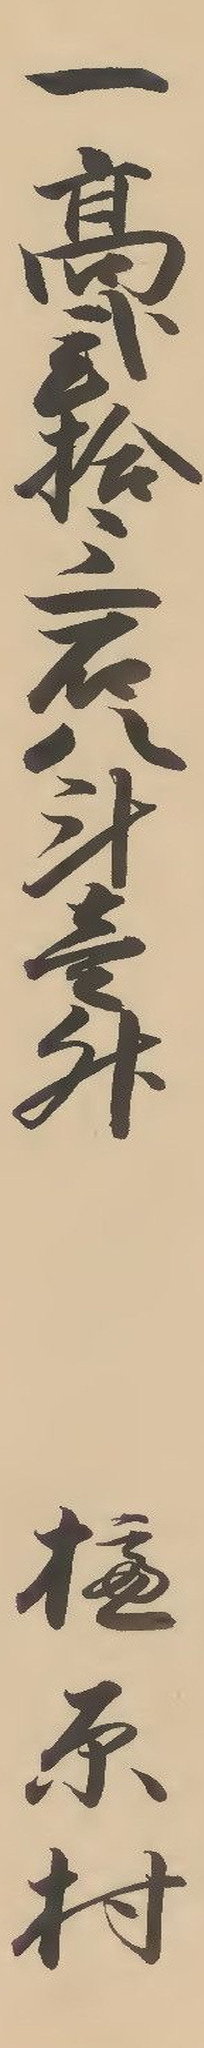一高弐拾三石八斗壱升櫨原村
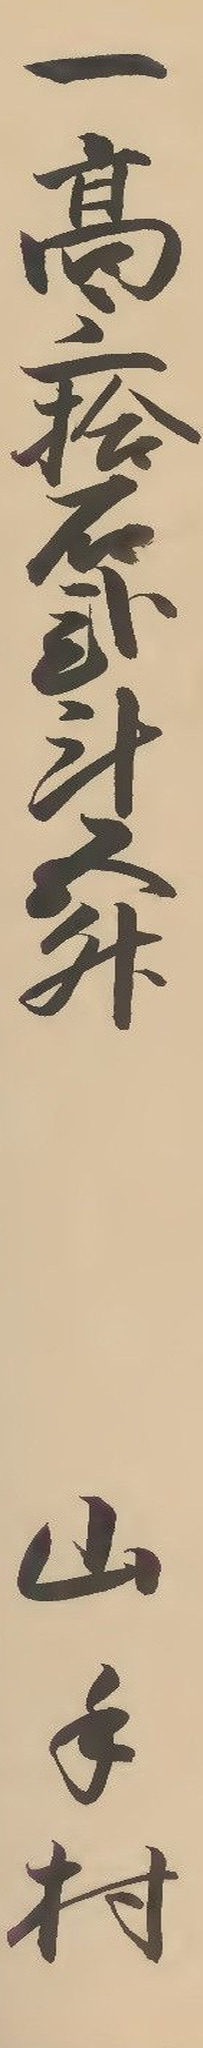一高三拾石弐斗五升山手村
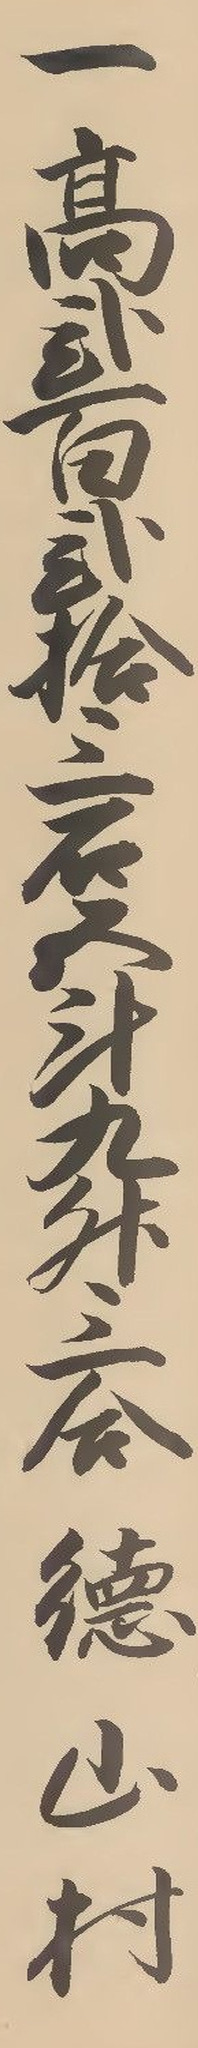一高弐百弐拾三石五斗九升三合徳山村
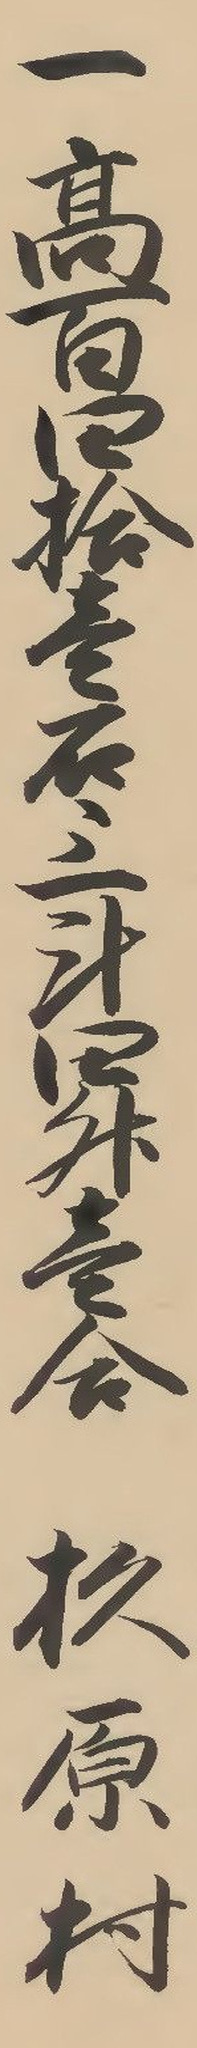一高百四拾壱石三斗四升壱合杉原村
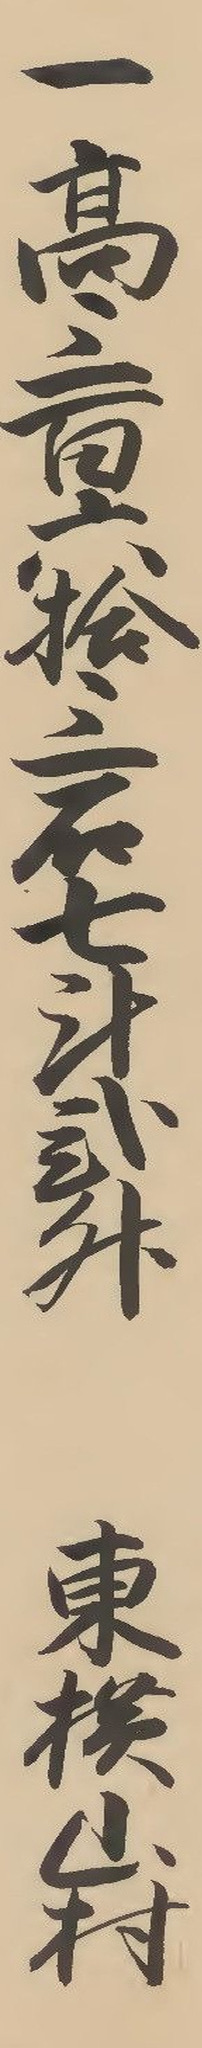一高三百六拾三石七斗弐升東横山村
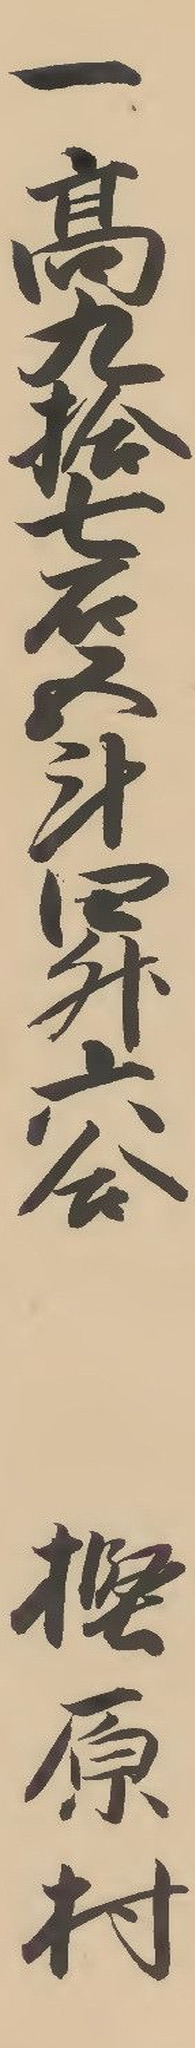一高九拾七石五斗四升六合樫原村

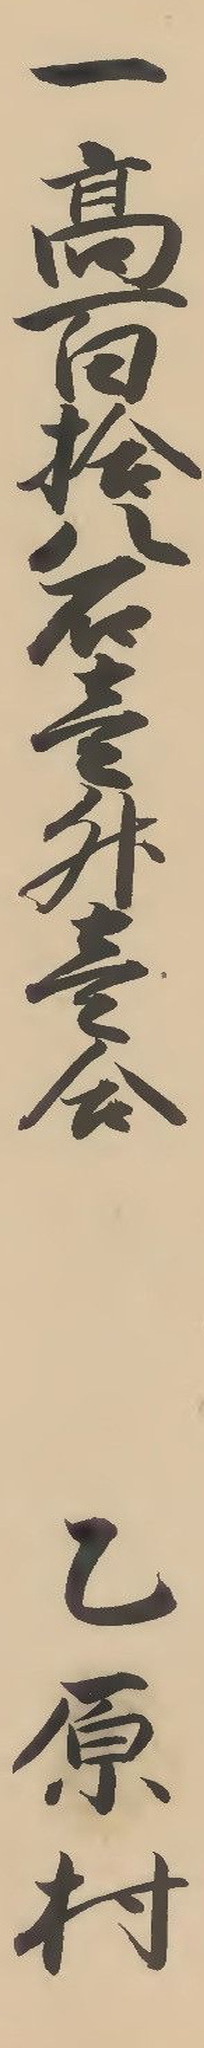一高百拾八石壱升壱合乙原村
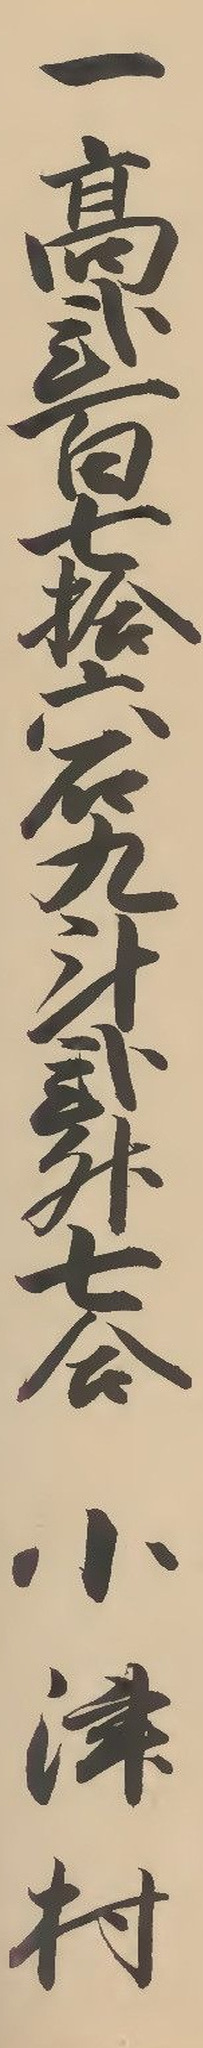一高弐百七拾六石九斗弐升七合小津村
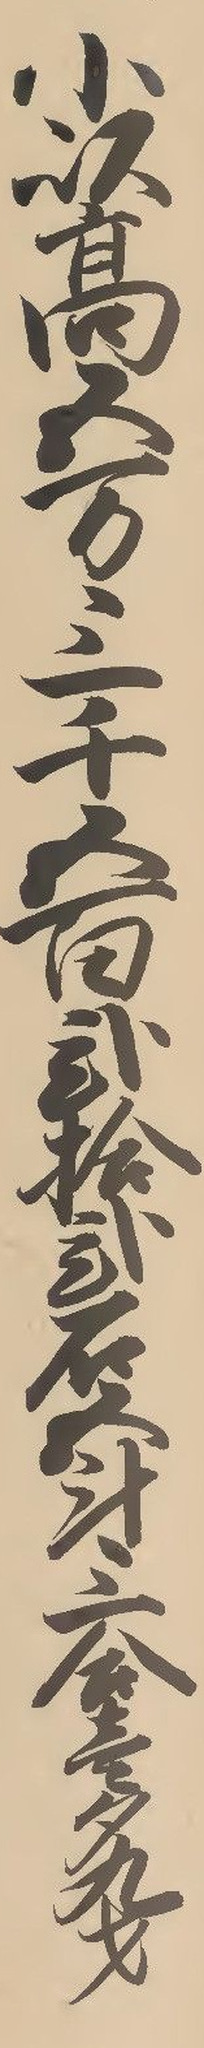小以高五万三千五百弐拾弐石五斗三合壱勺九才

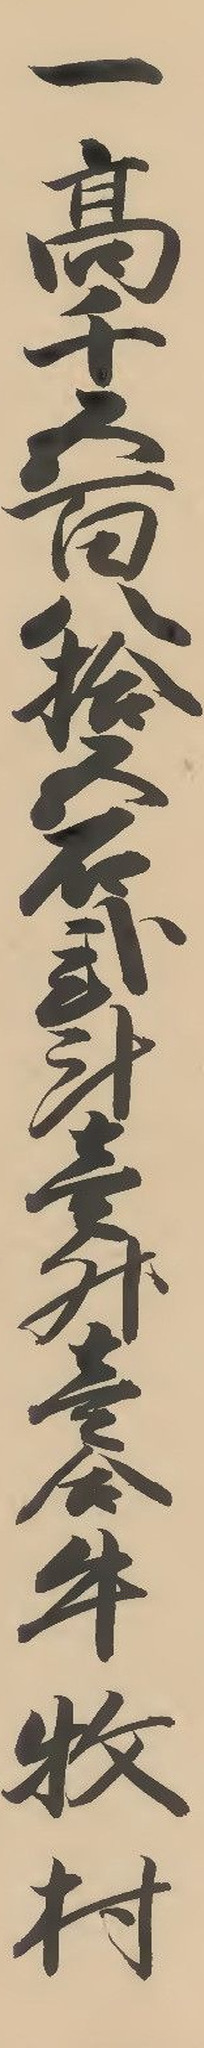一高千五百八拾五石弐斗壱升壱合牛牧村
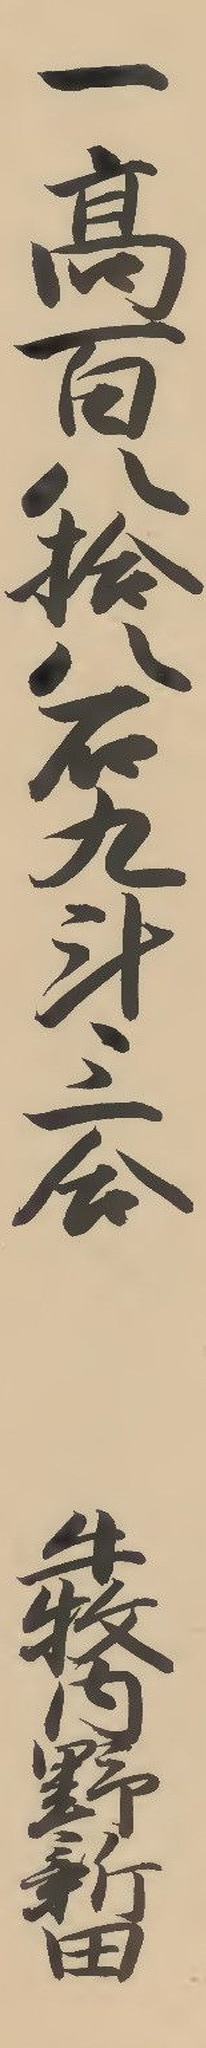一高百八拾八石九斗三合牛牧内野新田
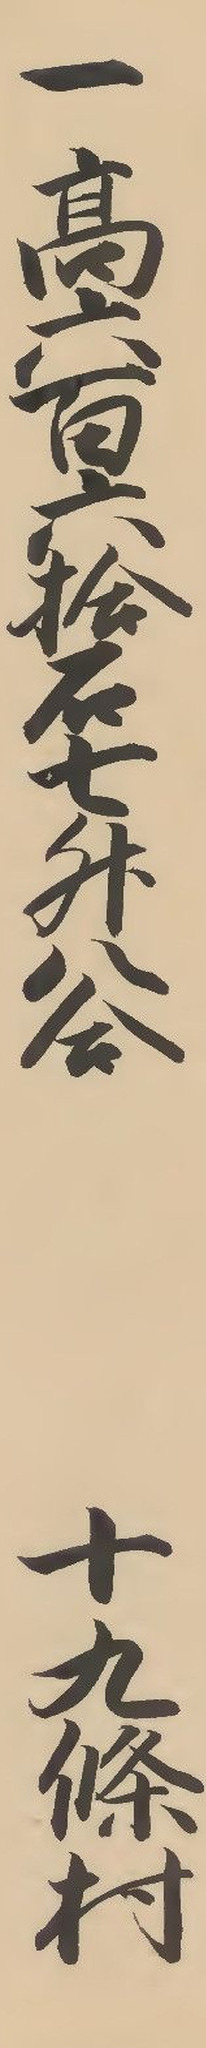一高六百六拾石七升八合十九条村
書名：美濃国郷帳
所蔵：国立公文書館 National Archives of Japan
